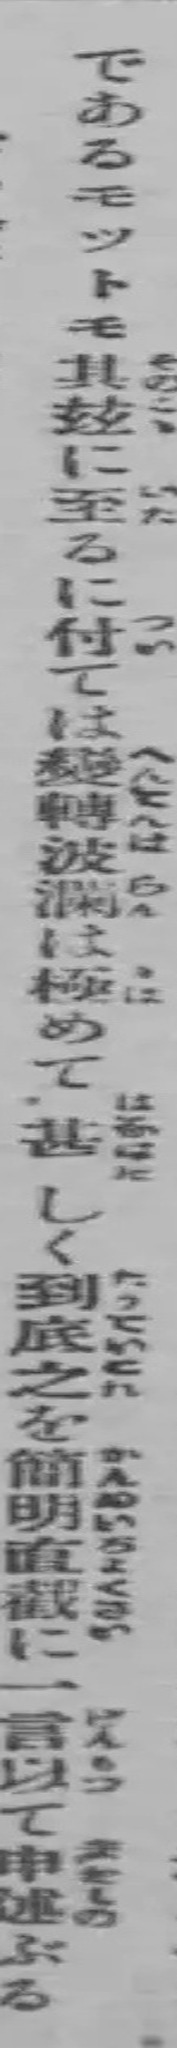であるモツトモ其茲に至るに付ては変転波瀾は極めて甚しく到底之を簡明直截に一言以て申述ぶる
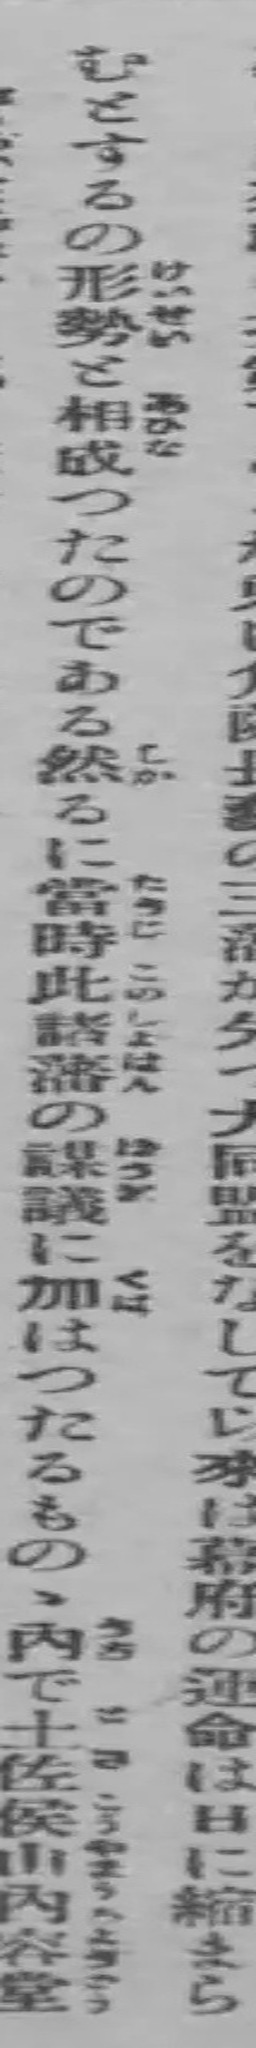むとするの形勢と相成つたのである然るに当時此緒藩の謀議に加はつたものゝ内で土佐侯山内容堂
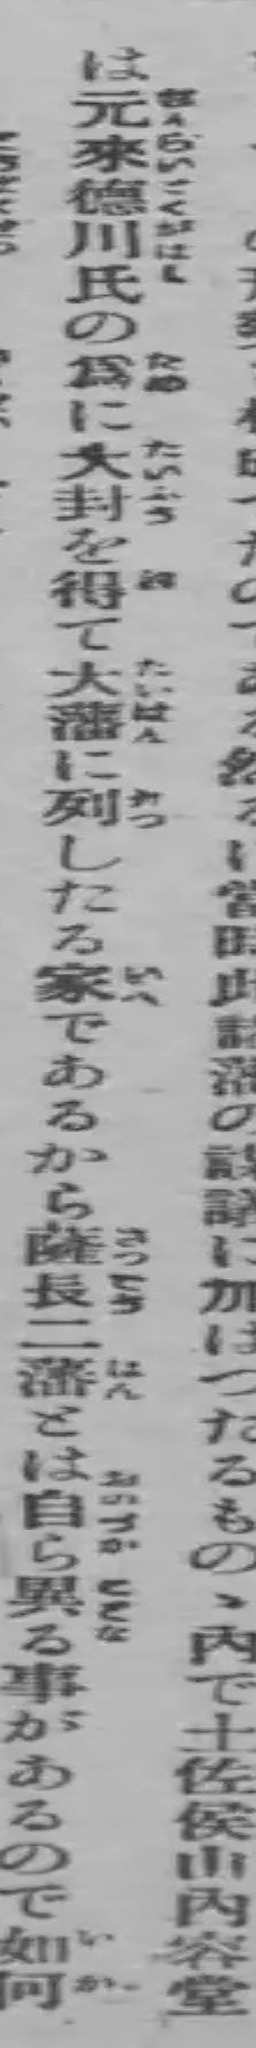は元来徳川氏の為に大封を得て大藩に列したる家であるから薩長二藩とは自ら異る事があるので如何
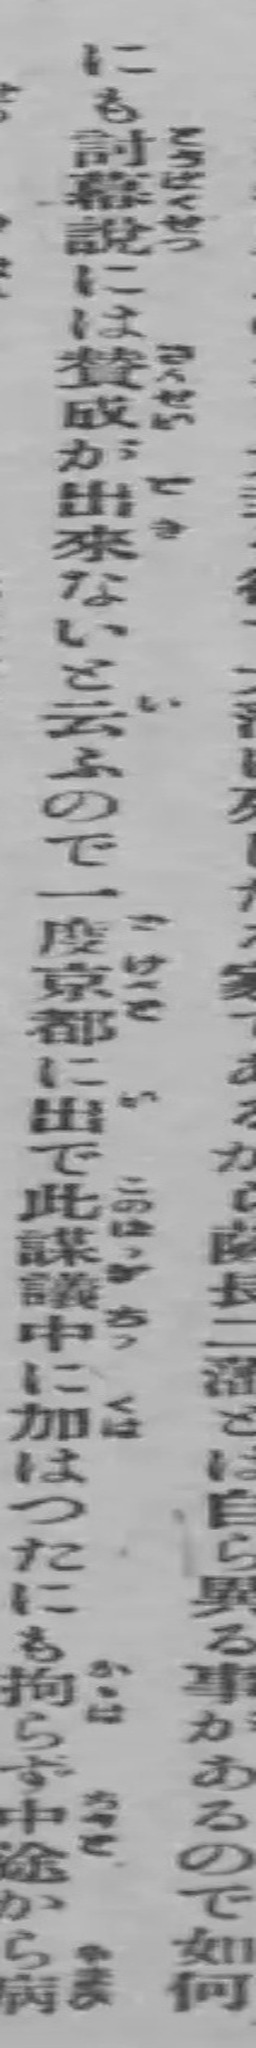にも討幕説には賛成が出来ないと云ふので一度京都に出で此謀議中に加はつたにも拘らず中途から病
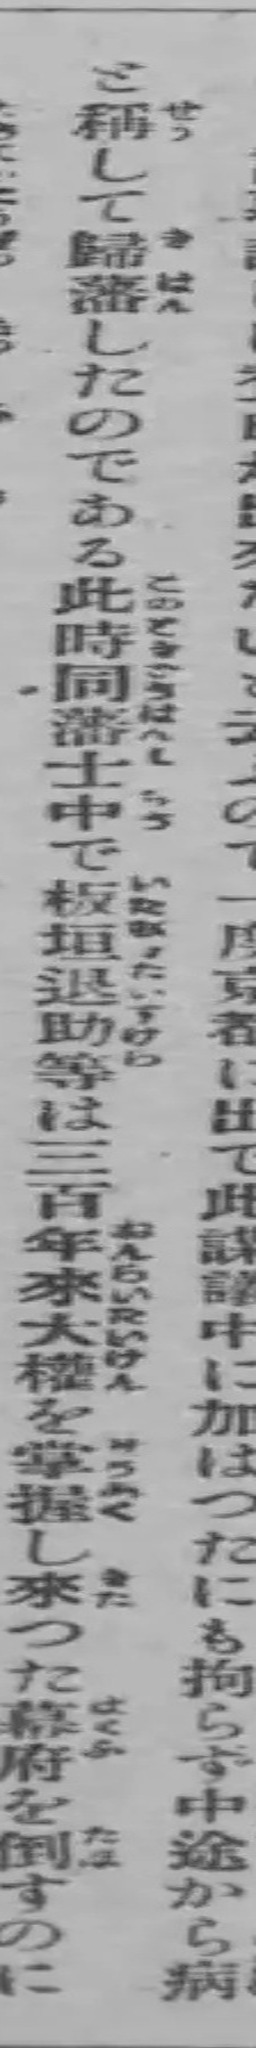と称して帰藩したのである此時同藩士中で板垣退助等は三百年来大権を掌握し来つた幕府を倒すのに
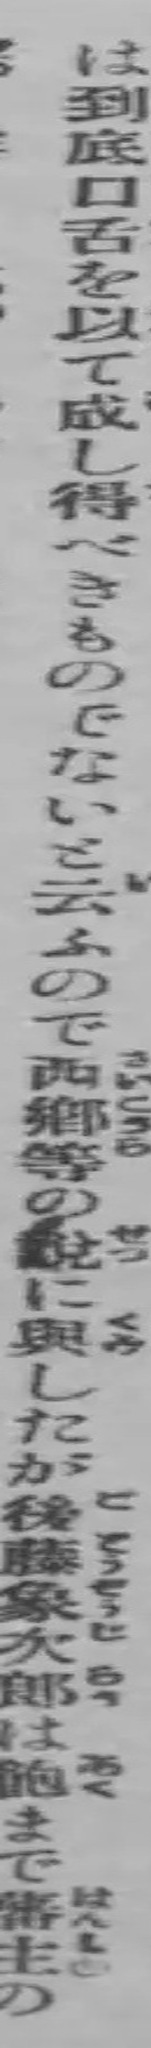は到底口舌を以て成し得べきものではないと云ふので西郷等の説に与したが後藤象次郎は飽まで藩主の
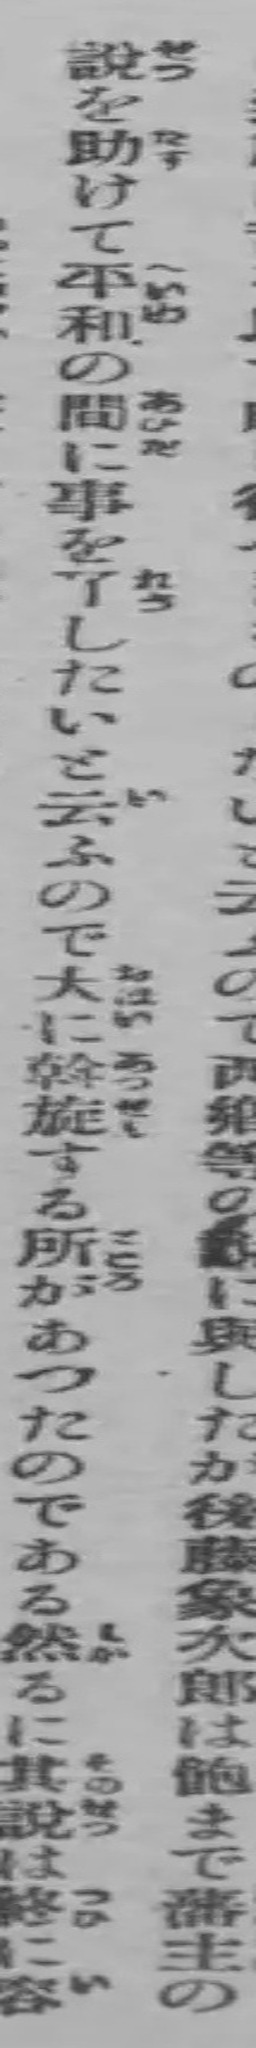説を助けて平和の間に事を了したいと云ふので大に斡旋する所があつたのである然るに其説は終に容
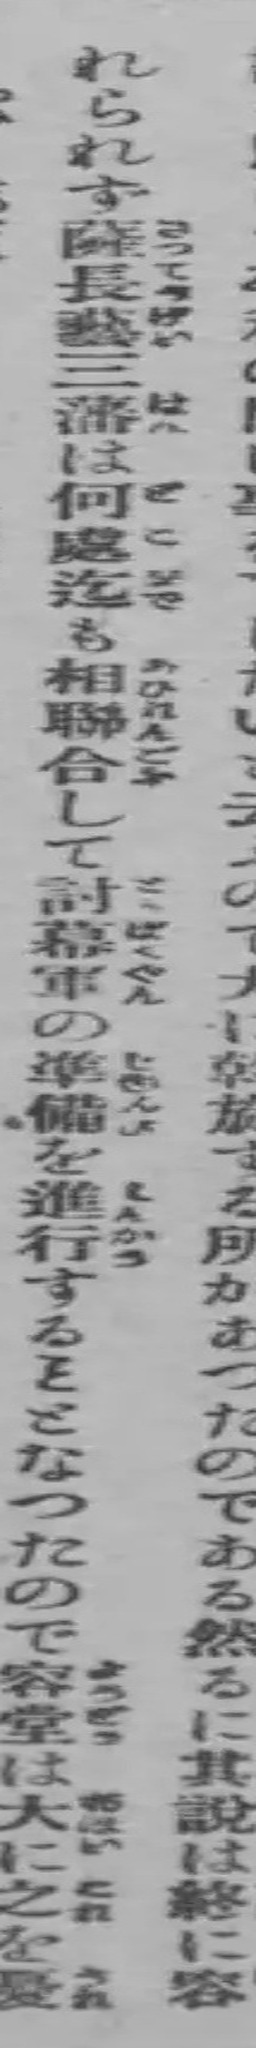れられず薩長芸三藩は何処迄も相連合して討幕軍の準備を進行することとなつたので容堂は大に之を憂
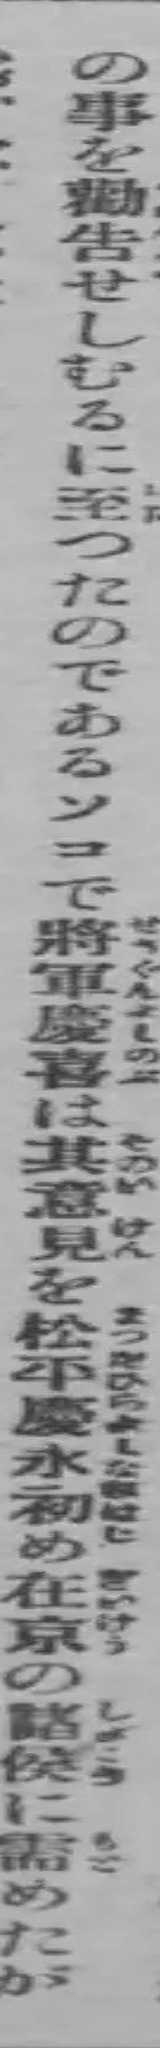の事を勧告せしむるに至つたのであるソコで将軍慶喜は其意見を松平慶永初め在京の諸侯に需めたが
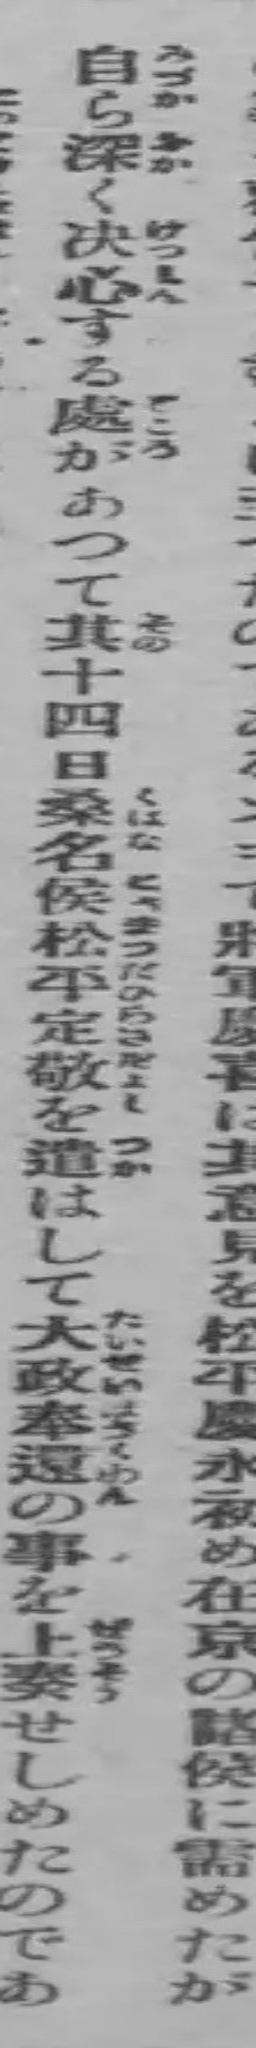自ら深く決心する処があつて其十四日桑名侯松平定敬を遣はして大政奉還の事を上奏せしめたのであ
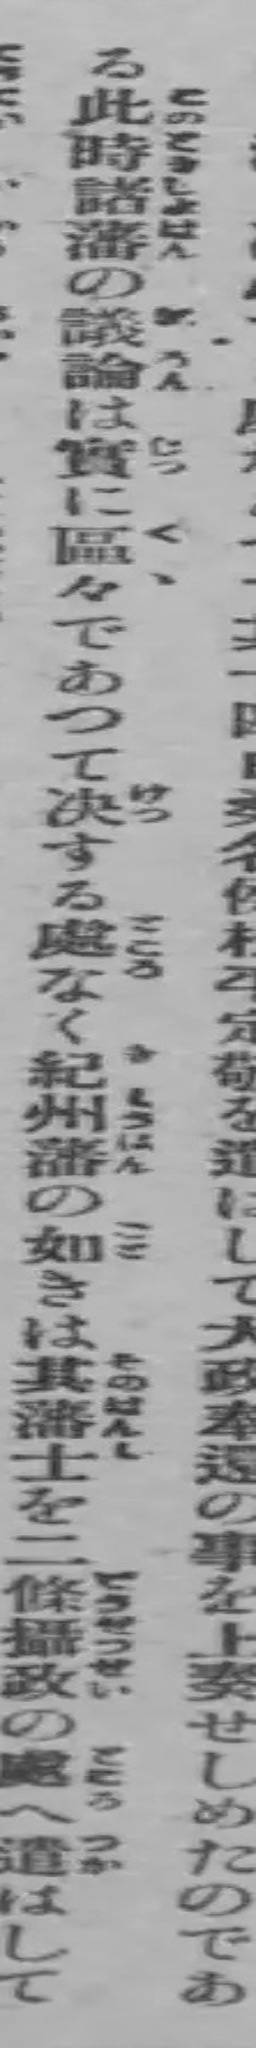る此時緒藩の議論は実に区々であつて決する処なく紀州藩の如きは其藩士を二條摂政の処へ遣はして
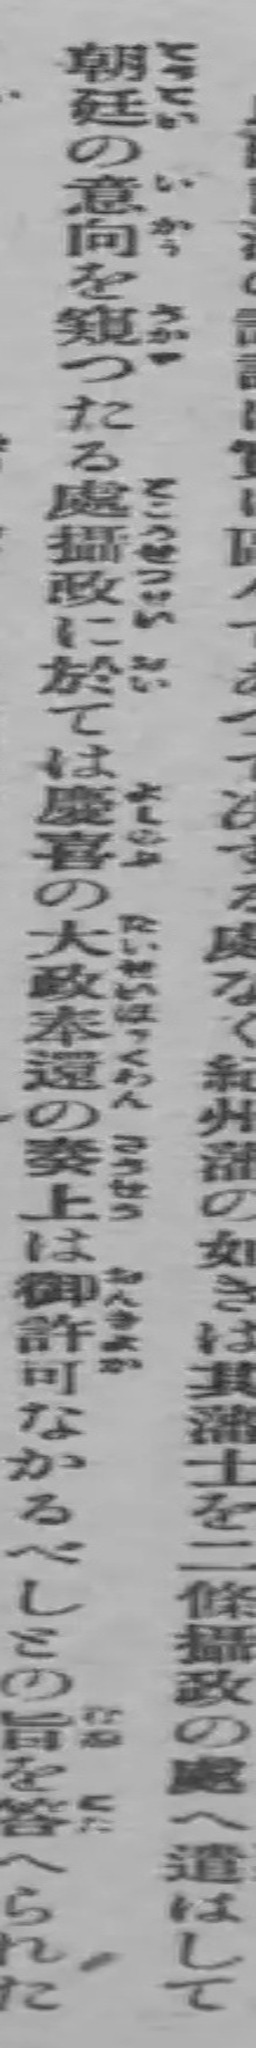朝廷の意向を窺つたる処摂政に於ては慶喜の大政奉還の奏上は御許可なかるべしとの旨を答へられた
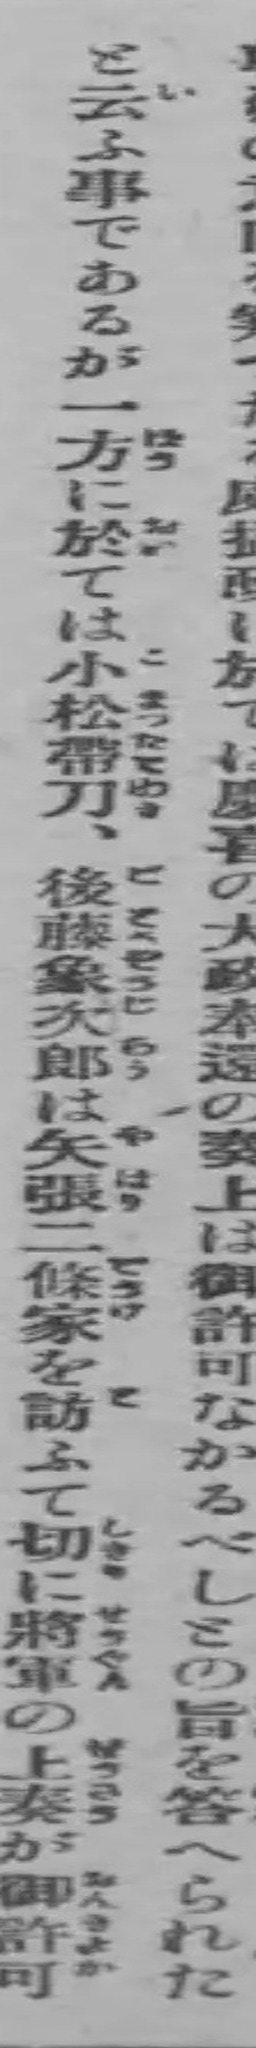と云ふ事であるが一方に於ては小松帯刀、後藤象次郎は矢張二條家を訪ふて切に将軍の上奏が御許可
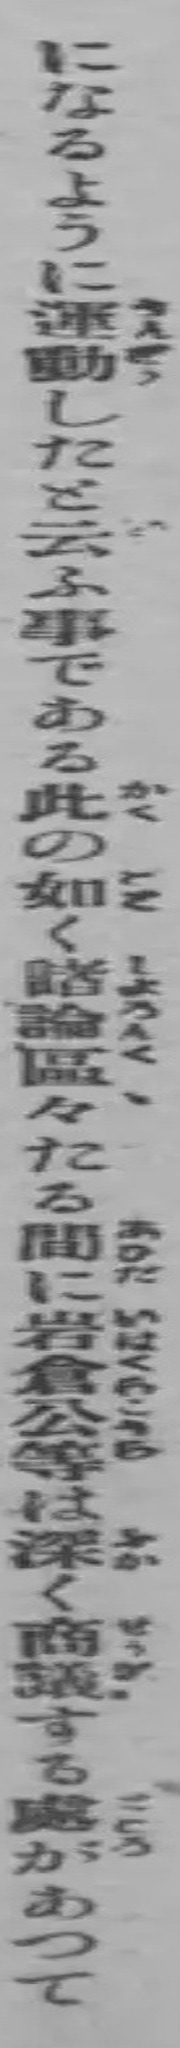になるように運動したと云ふ事である此の如く緒論区々たる間に岩倉公等は深く商議する処があつて
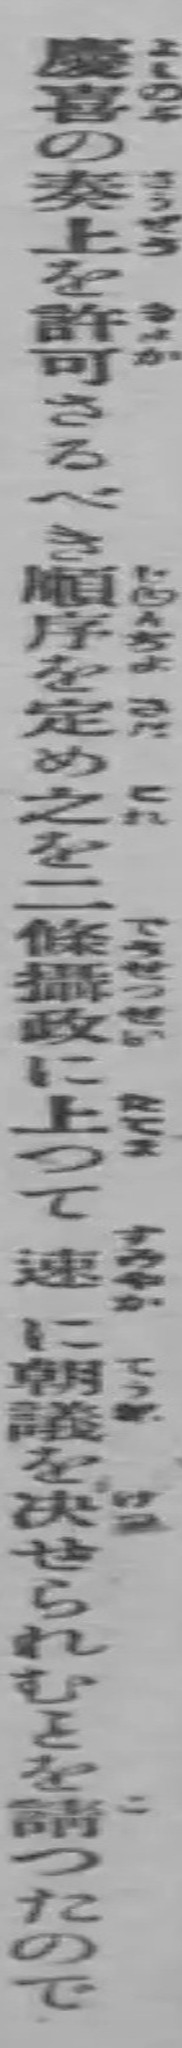慶喜の奏上を許可さるべき順序を定め之を二條摂政に上つて速に朝議を決せられむことを請つたので
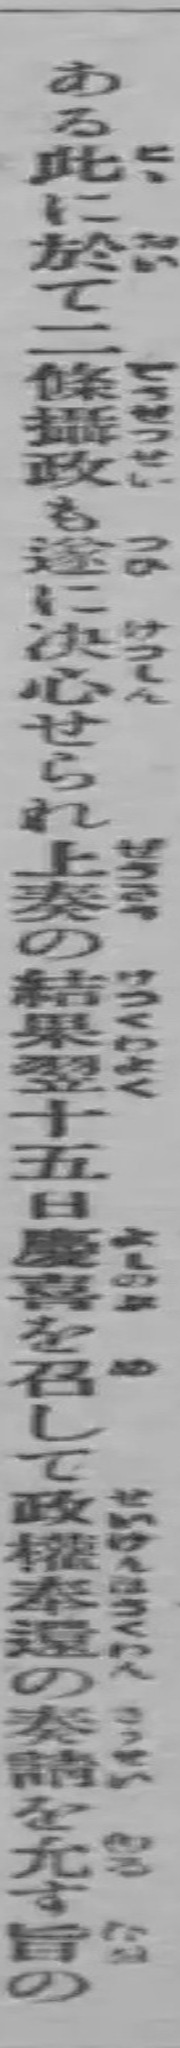大政の奉還ある此に於て二條摂政も遂に決心せられ上奏の結果翌十五日慶喜を召して政権奉還の奏請を允す旨の
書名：豊橋市史談
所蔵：国立国会図書館 National Diet Library, JAPAN
